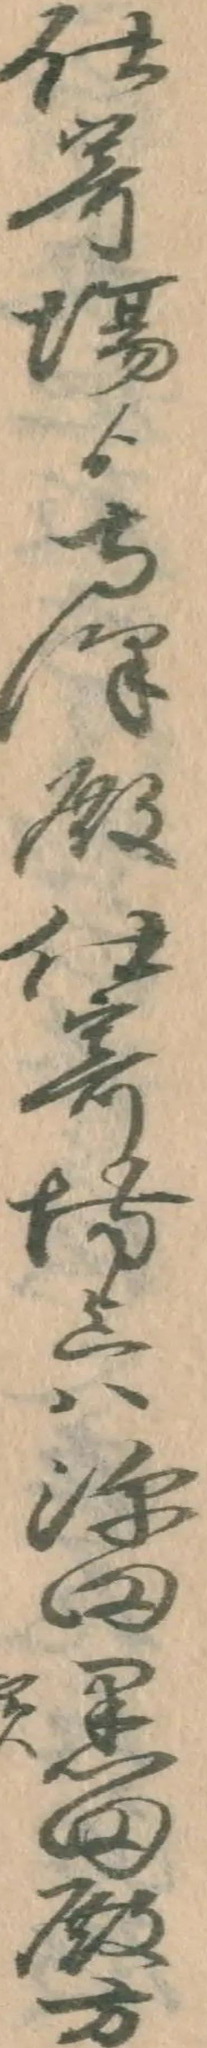仕寄場ゟ寺沢殿仕寄場迄は深田黒田殿方
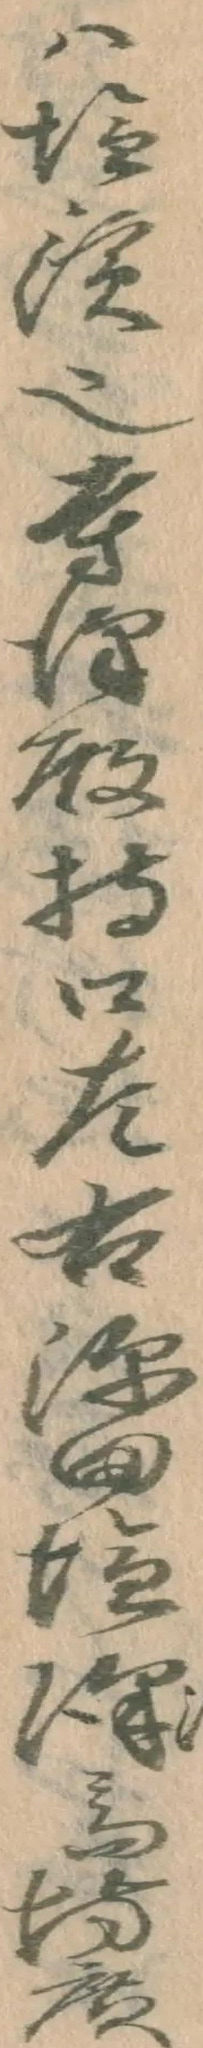は塩浜也寺沢殿持口左右深田塩沢に而場広
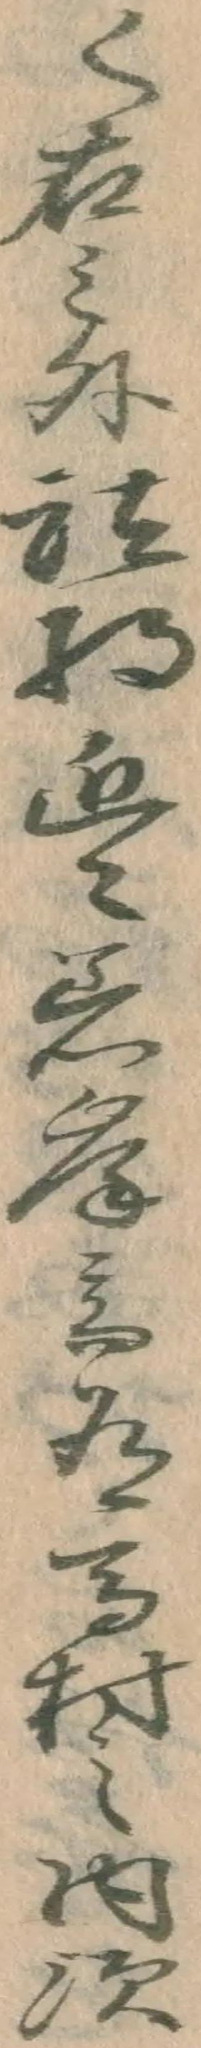く右之外諸将近々着岸に而有馬村之内須
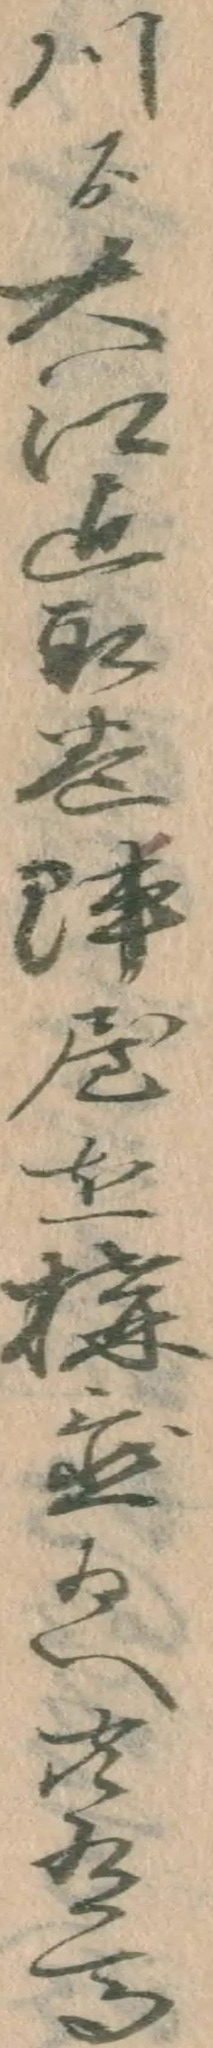川ゟ大江迄取巻陣屋を構置ゐへ共有馬
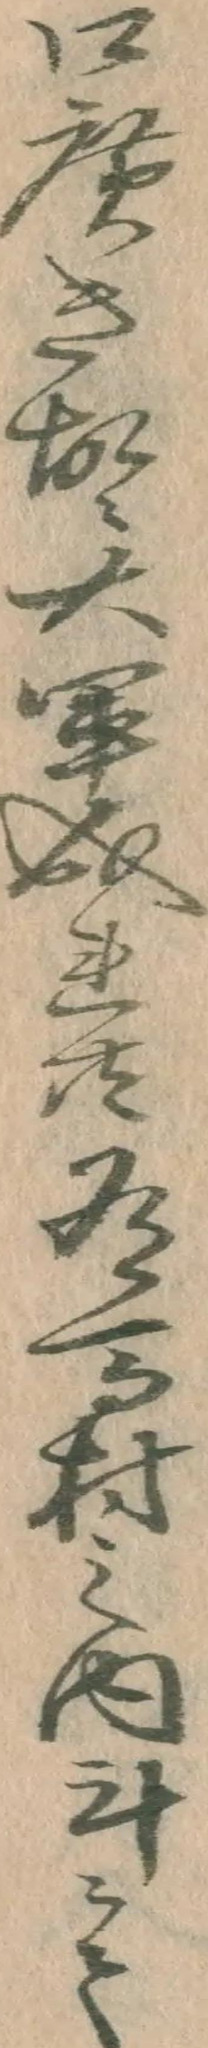口広き故に大軍成連共有馬村之内斗にて
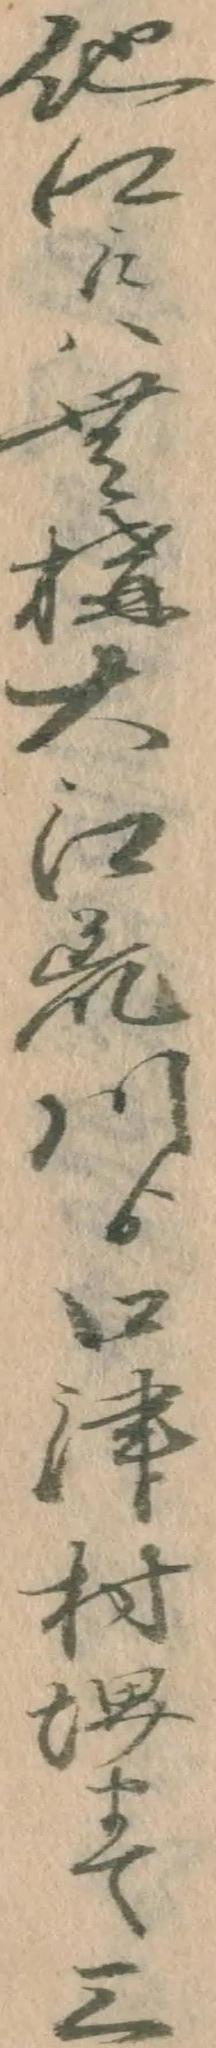他郷江は無構大江荒川ゟ口津村堺まて三
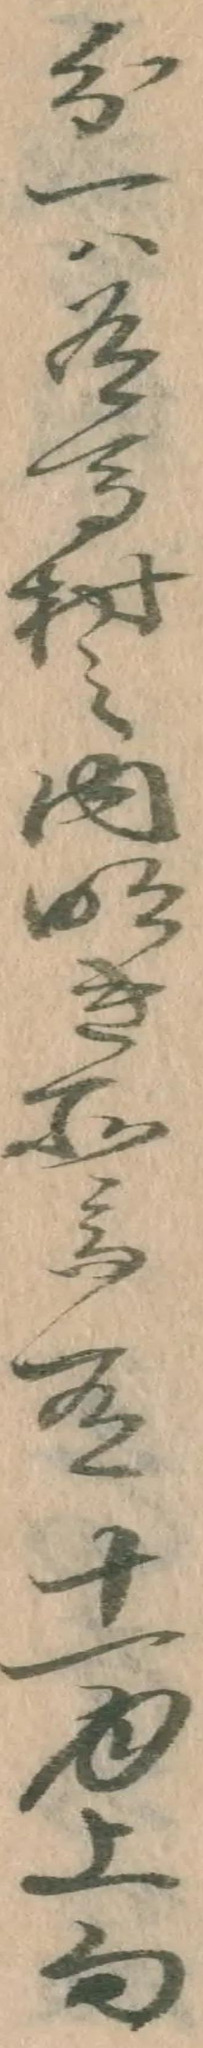分一は有馬村之内明き所に而有十一月上旬
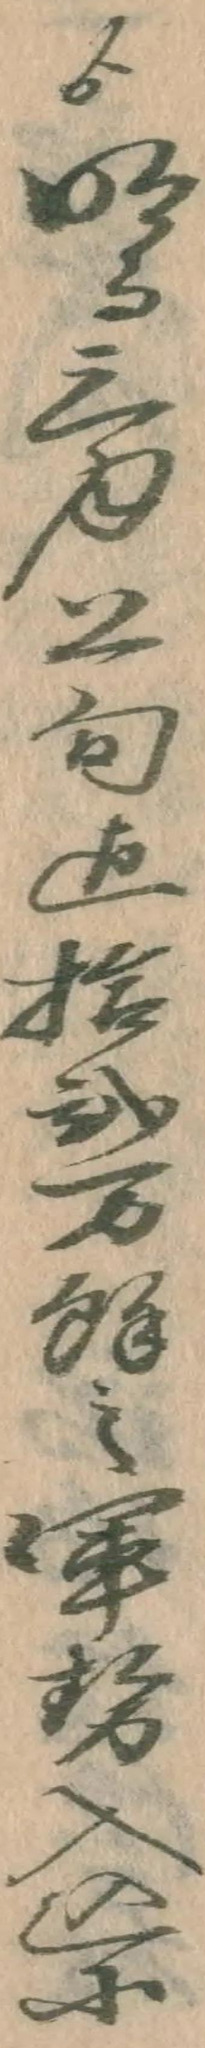ゟ明る三月上旬迄拾弐万余之軍勢入込小
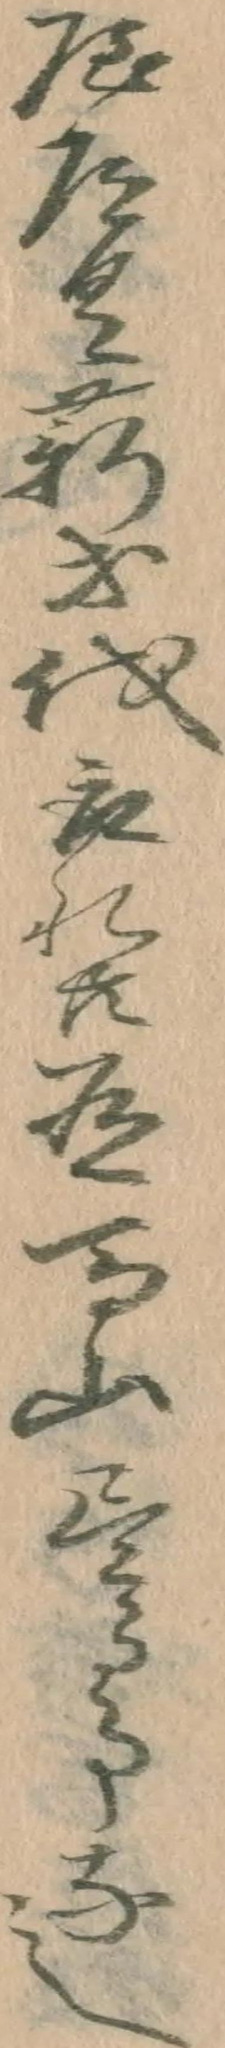屋道具薪等伐取れ共有馬山尽る事なし
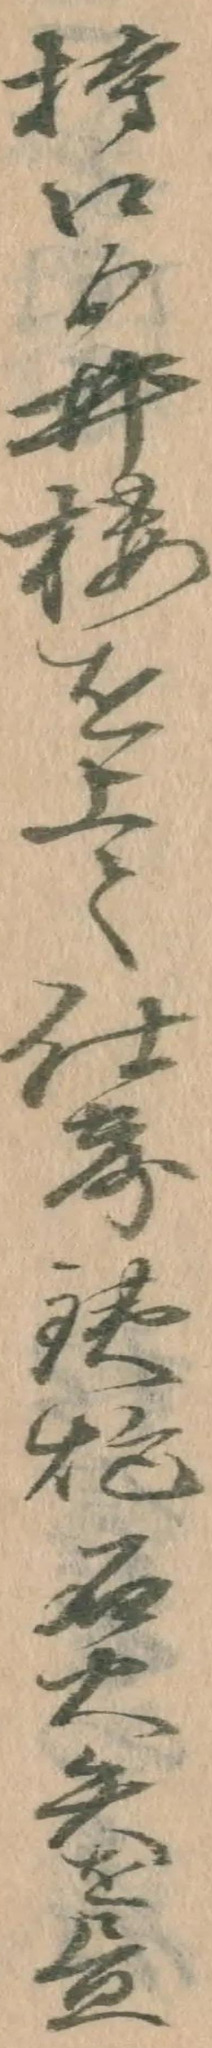持口ゟ井樓を上て仕寄鉄砲石火矢を昼
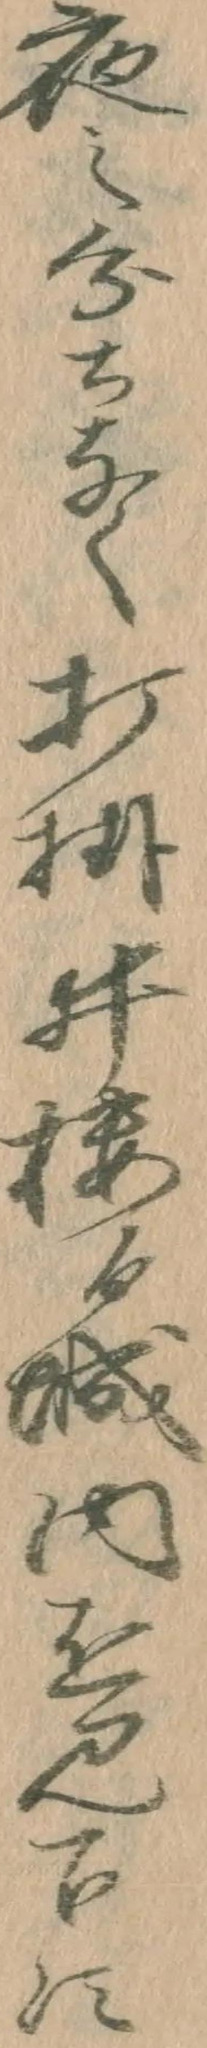夜之分ちなく打掛井樓ゟ城内を見下須
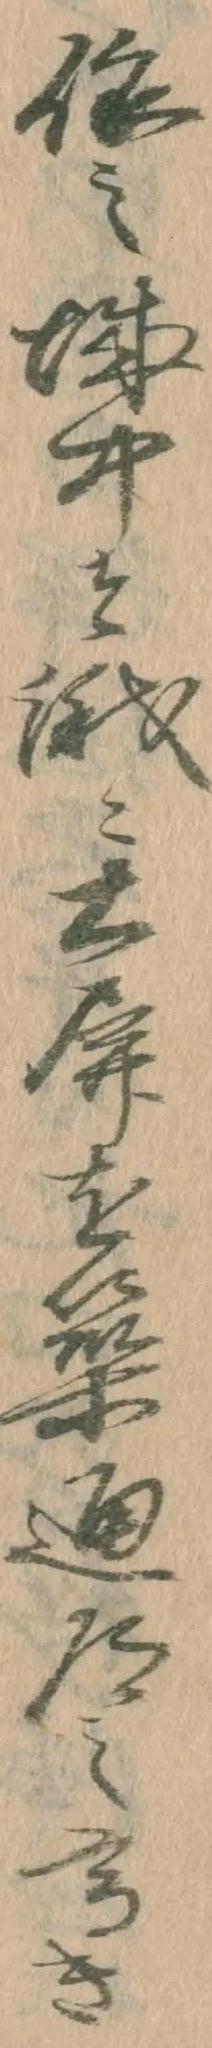依之城中者俄に土屏を築通道之高き
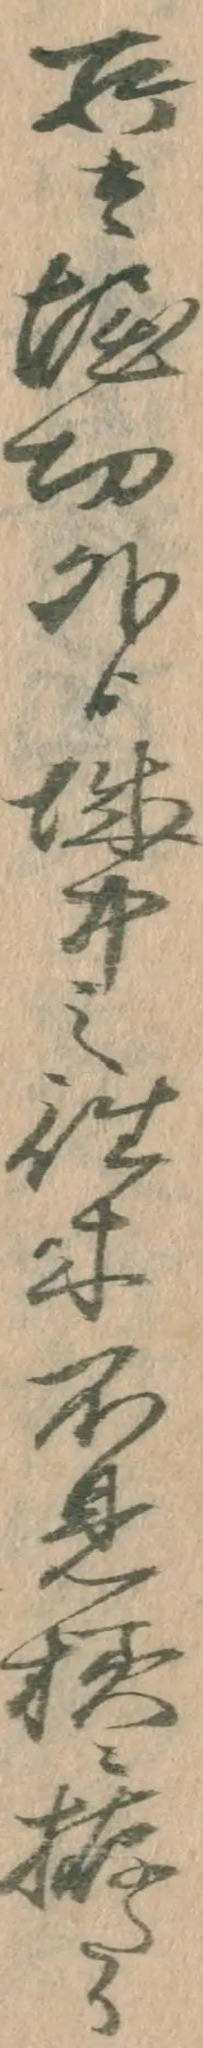所者堀切外ゟ城中之往来不見様に拵たり
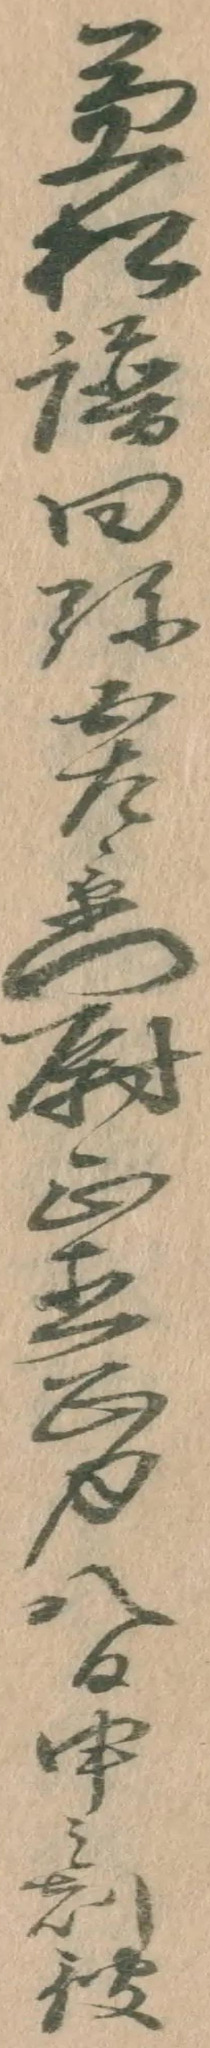兼松譜曰弥五左衛門尉正直正月八日申之刻彼
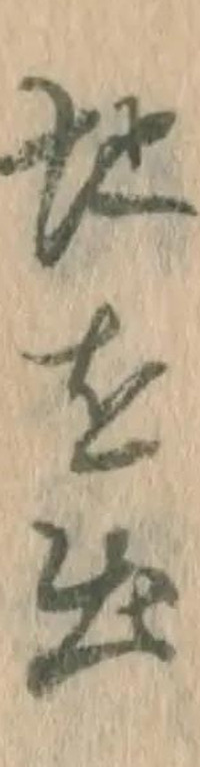地を出
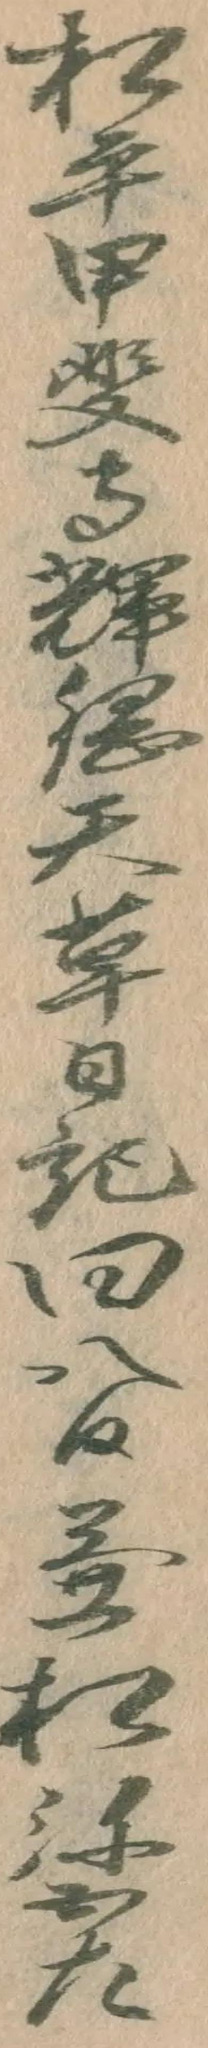松平甲斐守輝綱天草日記曰八日兼松弥五左
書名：切支丹御退治記 49巻. [5]
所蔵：国立国会図書館 National Diet Library, JAPAN
